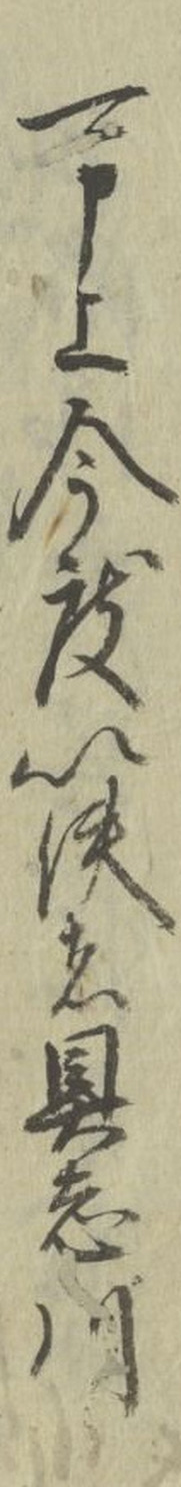可申上今度以使者具志川
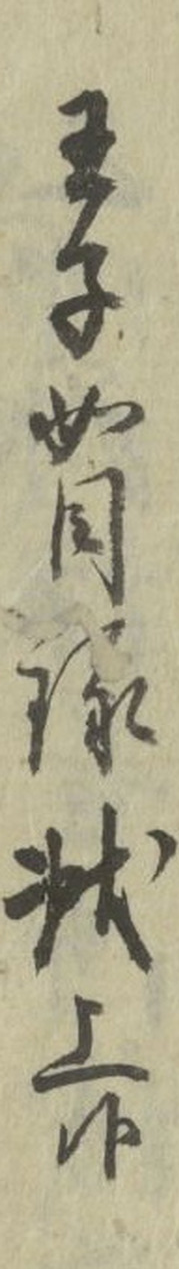王子如目録献上候
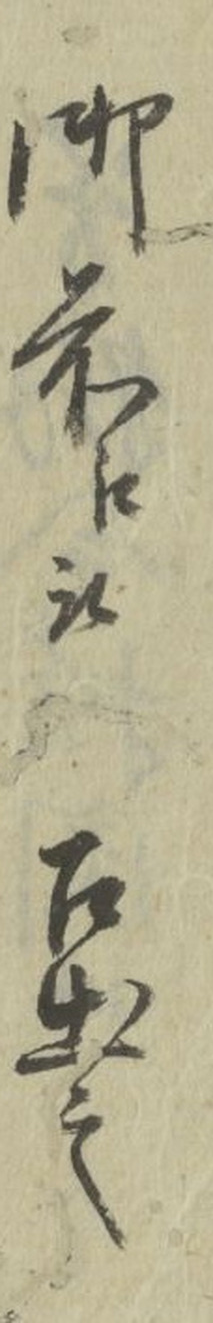御前え被召出之
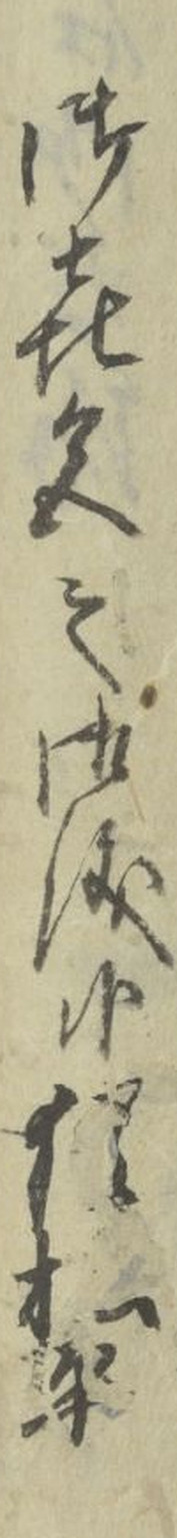御喜色之御儀候猶松平
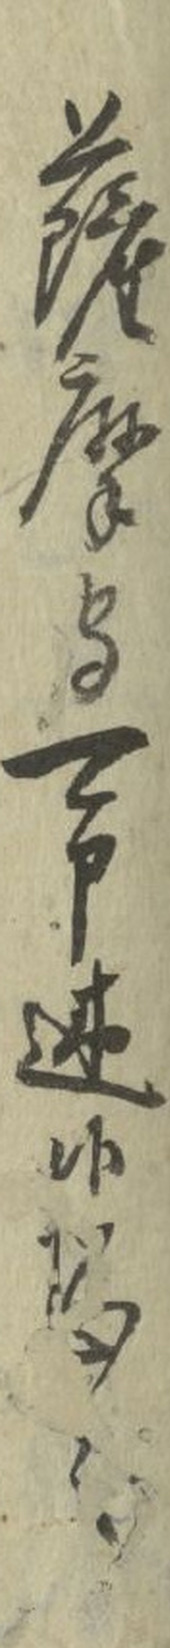薩摩守可申述候恐々
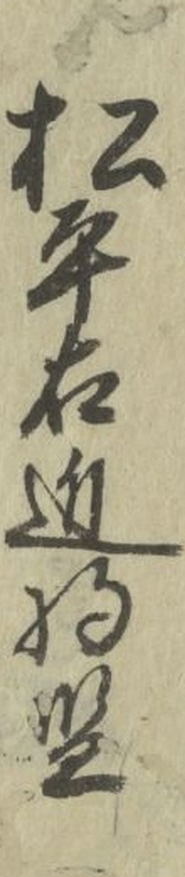松平右近将監
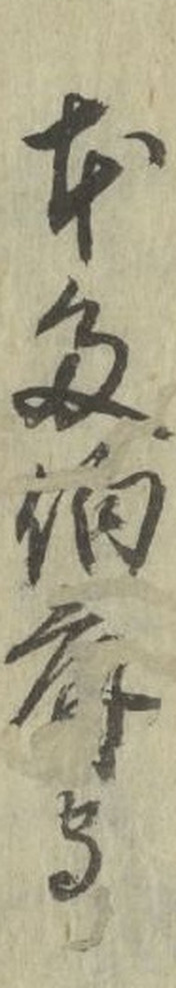本多伯耆守

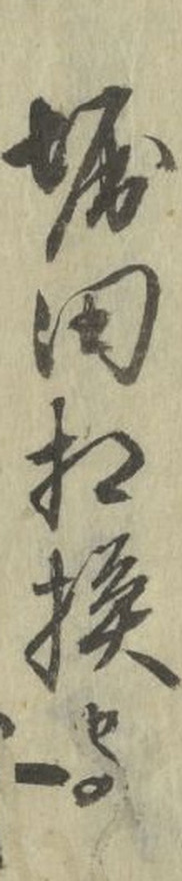堀田相模守
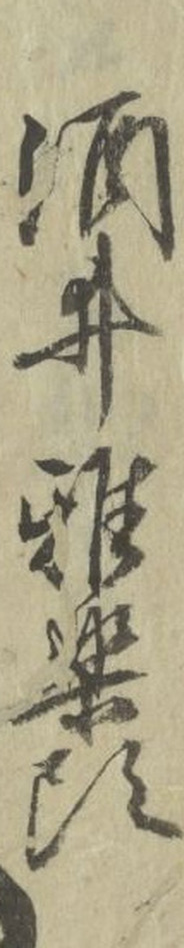酒井雅楽頭
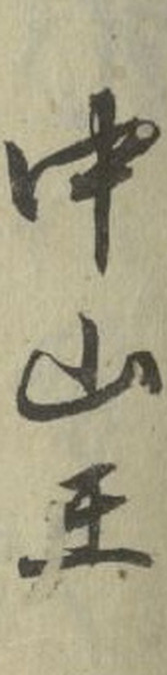中山王
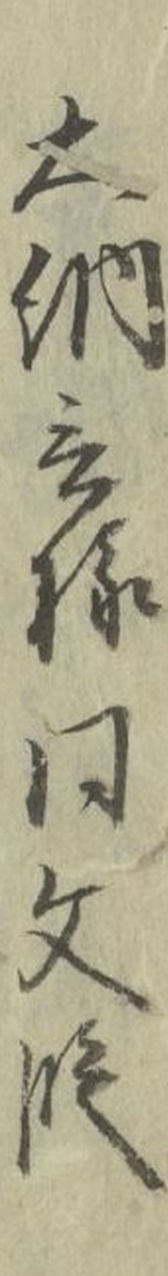大納言様同文段
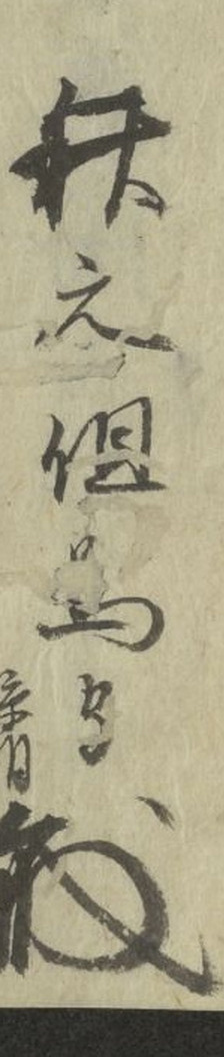秋元但馬守

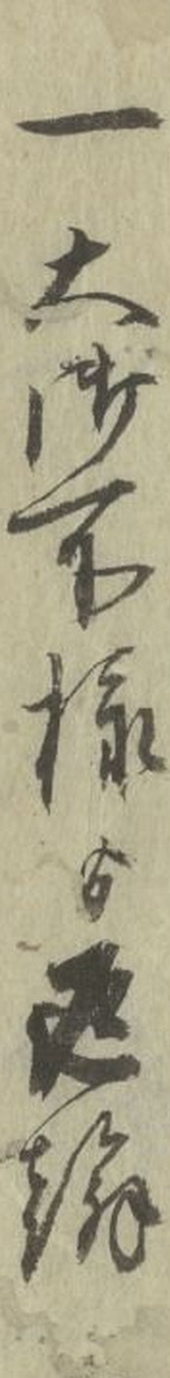一大御所様ゟ返翰
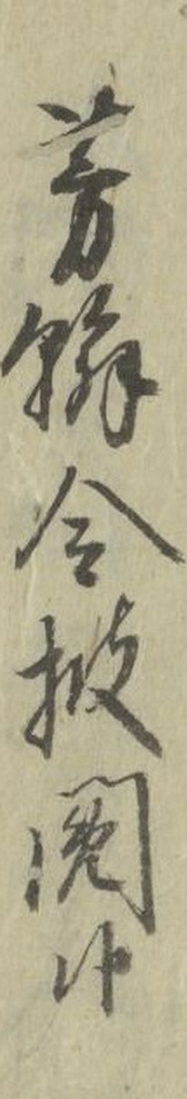芳翰命披閲候
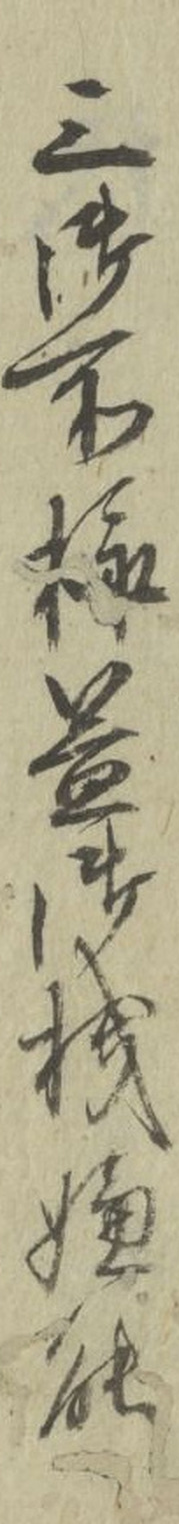三御所様益御機嫌能
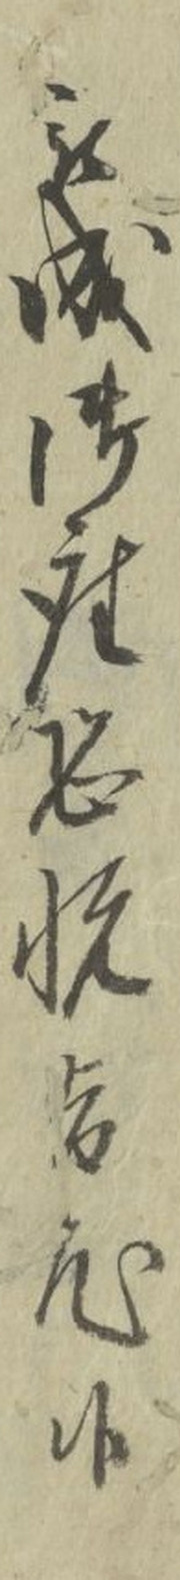被成御座恐悦旨尤候
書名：琉球来朝記 自八至十四終
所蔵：University of the Ryukyus Library
